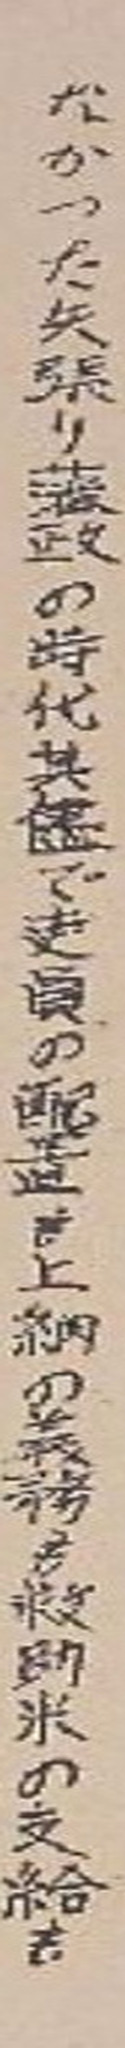なかつた矢張り藩政の時代其儘で吏員の配置も上納の義務も救助米の支給も
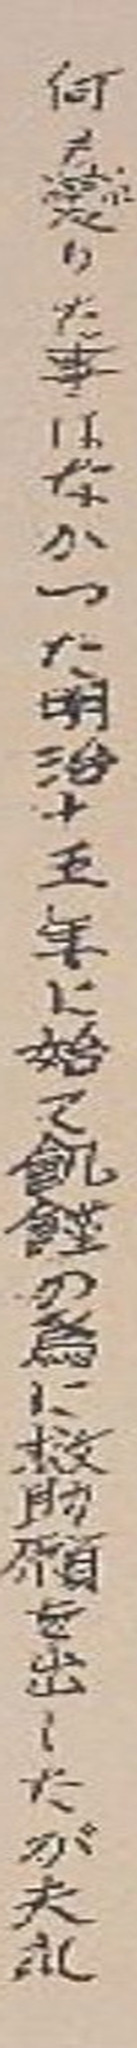何も変りた事はなかつた明治十五年に始て飢饉の為に救助願を出したが夫れ
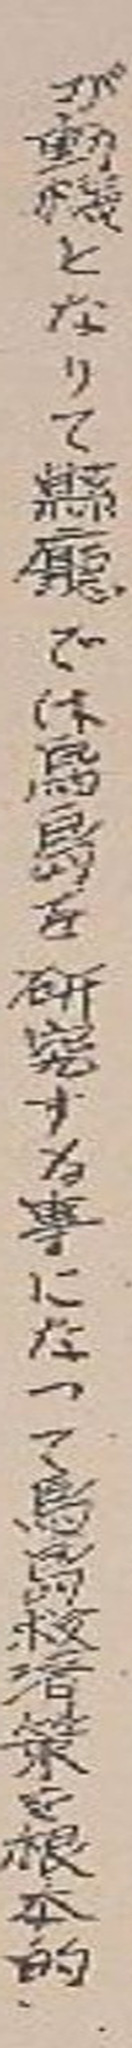が動機となりて県庁では鳥島を研究する事になつて鳥島救済策を根本的
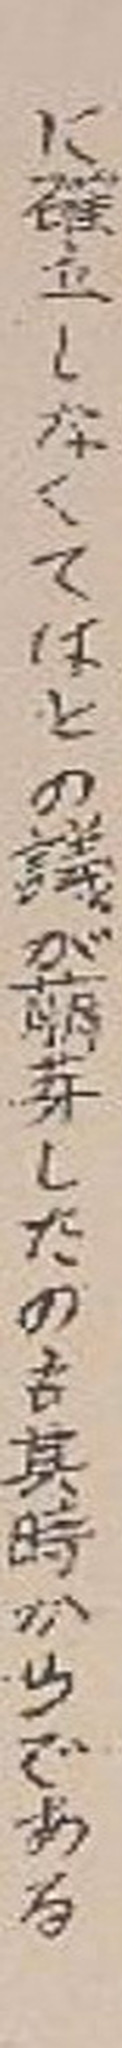に確立しなくてはとの議が萌芽したのも其時からである
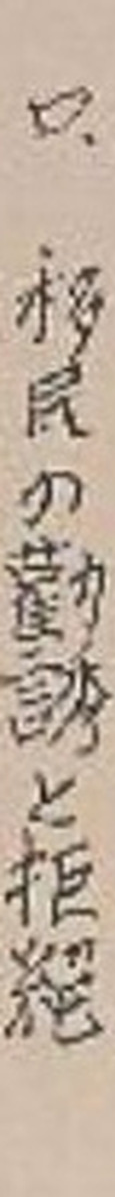ロ．移民の勧誘と拒絶
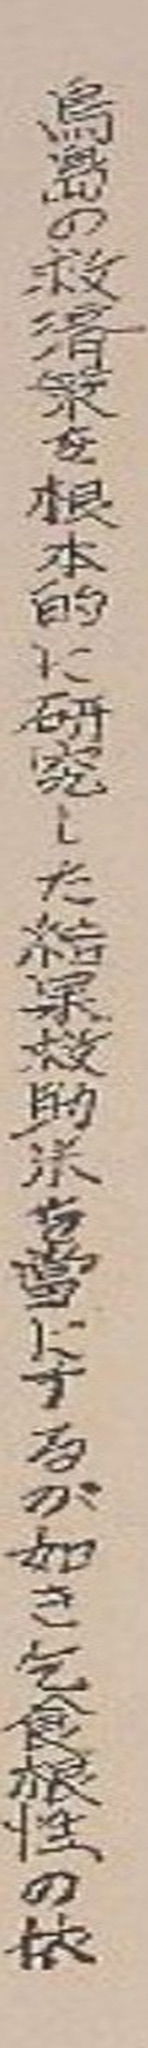鳥島の救済策を根本的に研究した結果救助米を当にするが如き乞食根性の依
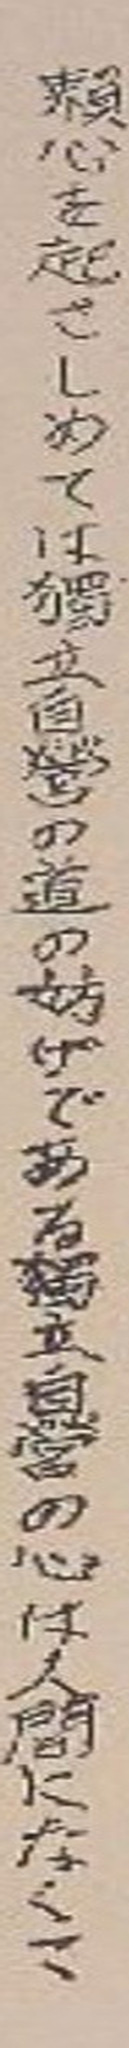頼心を起さしめては独立自営の道の妨げである独立自営の心は人間になくて
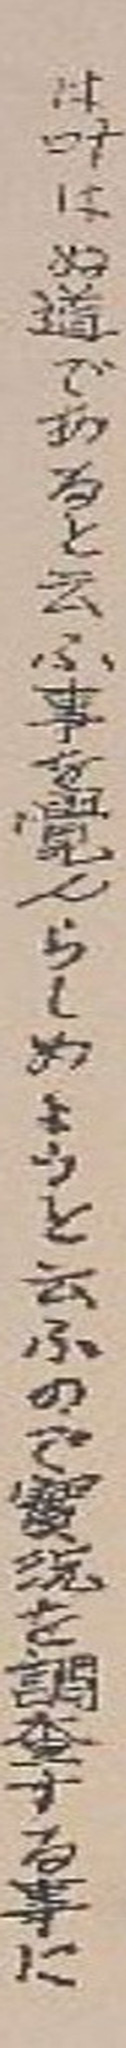は叶はぬ道であると云ふ事を覚んらしめようと云ふので実況を調査する事に
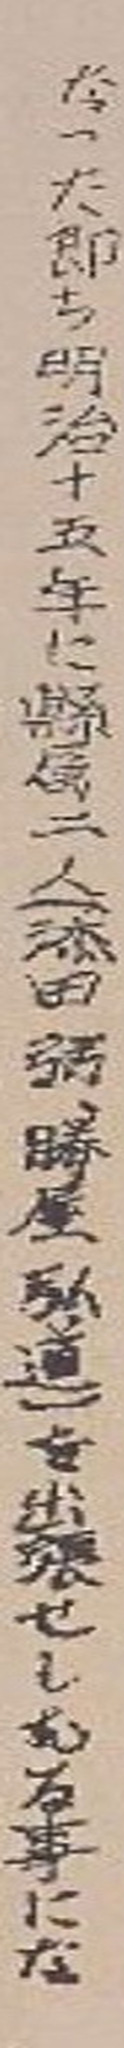なつた即ち明治十五年に県属二人(添田弥、勝屋弘道)を出張せしむる事にな
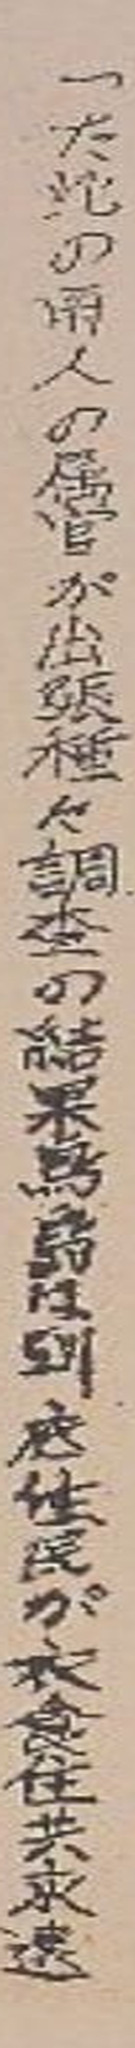つた此の両人の属官が出張種々調査の結果鳥島は到底住民が衣食住共求遠
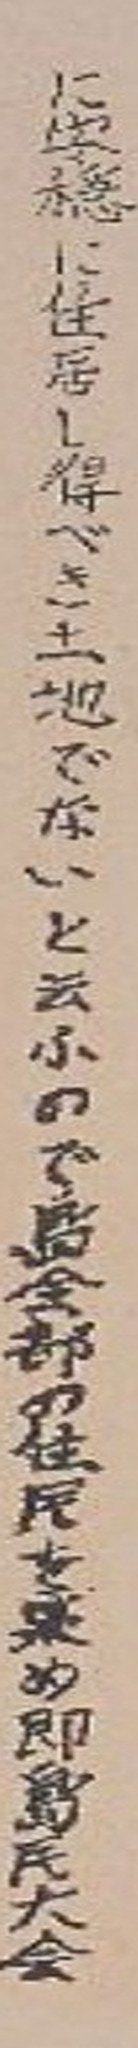に安穏に住居し得べき土地でないと云ふので島全部の住民を集め即島民大会
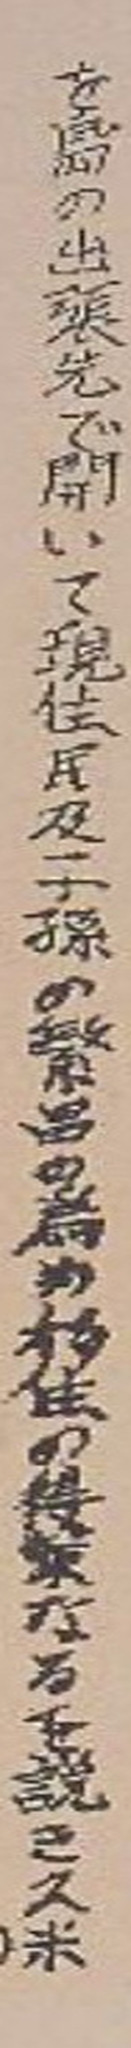を島の出張先で開いて現住民及子孫の繁昌の為め移住の得策なるを説き久米

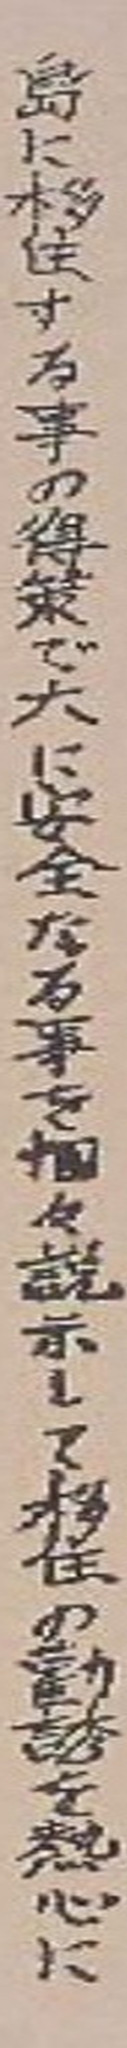島に移住する事の得策で大に安全なる事を悃々説示して移住の勧誘を熱心に
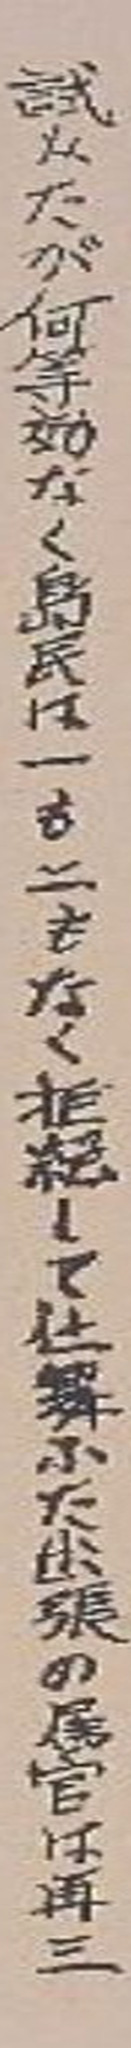試みたが何等効なく島民は一も二もなく拒絶して仕舞ふた出張の属官は再三
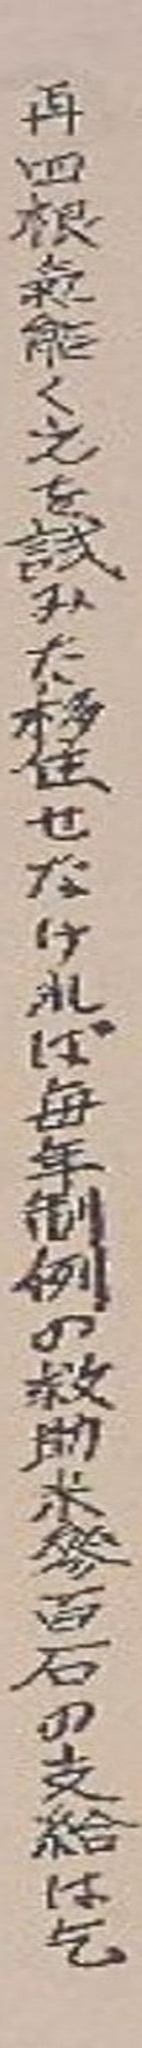再四根気能く之を試みた移住せなければ毎年制例の救助米参百石の支給は乞
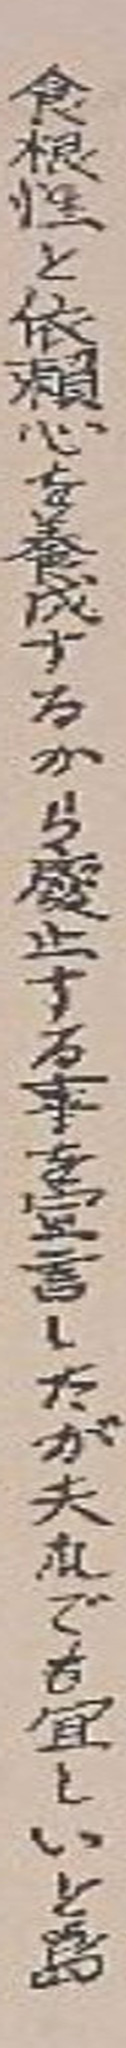食根性と依頼心を養成するから廃止する事を宣言したが夫れでも宜しいと島
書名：鳥島移住始末
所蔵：University of the Ryukyus Library
